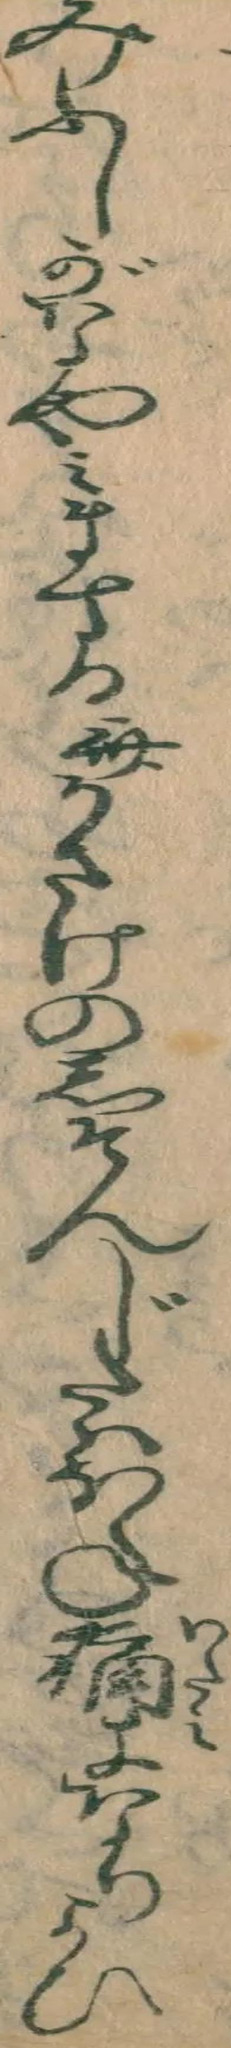みふしがなやみまする斎かさけのしそんじたはほね痛になりよひ
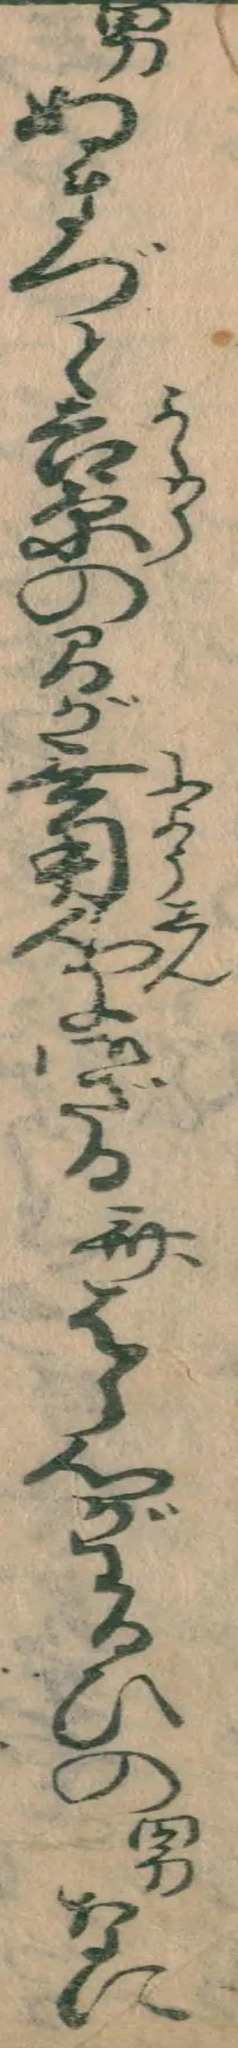男ぬまづと吉原の間が無用心に御ざる斎はら心がわるひの男なに
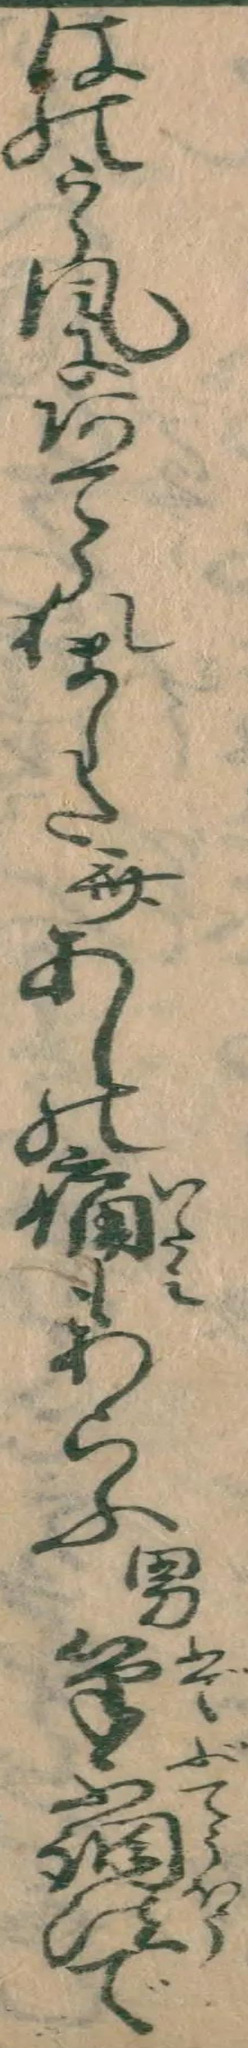はのうら風にあてられました斎あしの痛もあらふ男筆不調法で
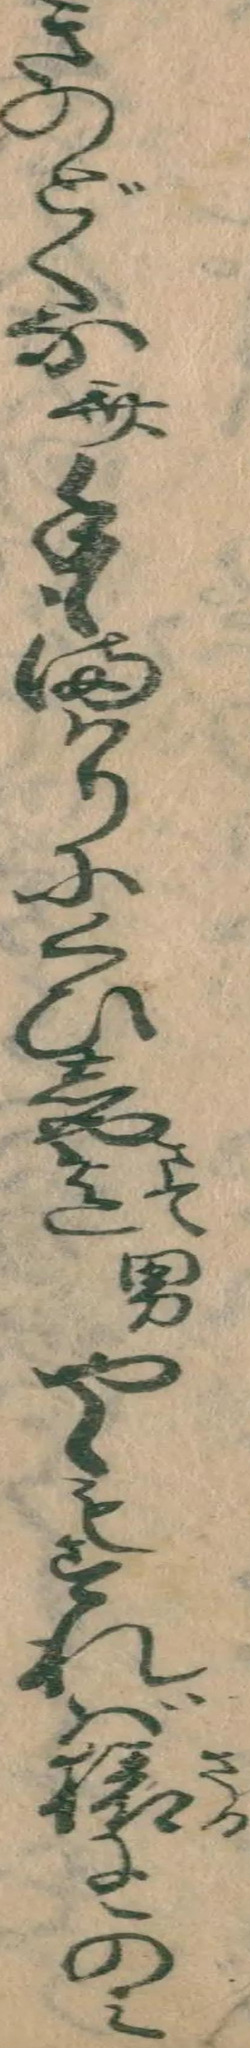きのどくな斎手もまはりにくひしや迄男やゝもすれば猿にのみ
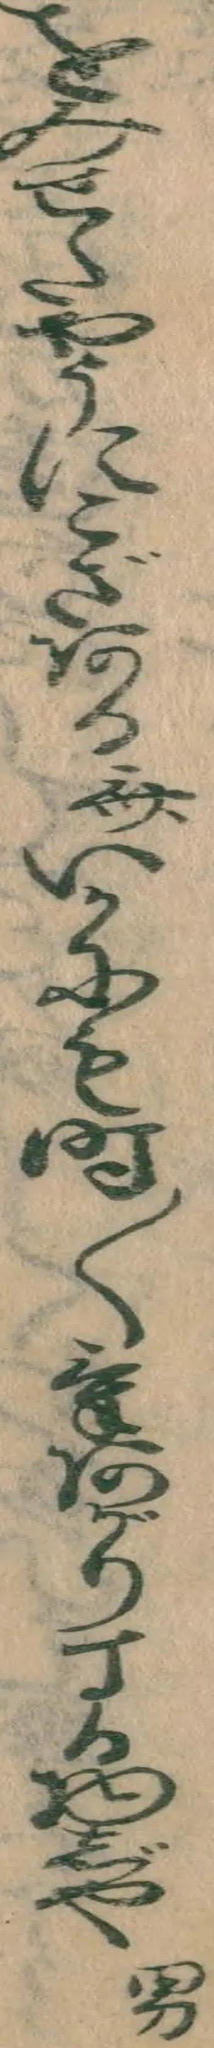をみせたやうにこざある斎いかにも時々気あがりする物じや男
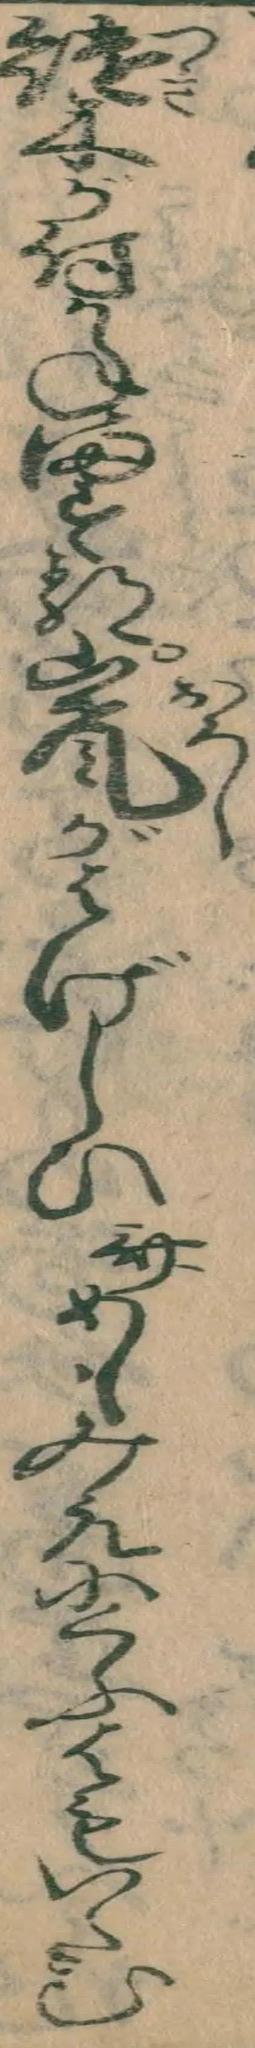継木が付かねまする。山颪がはげしひ斎めもみえにくふはもいたむ
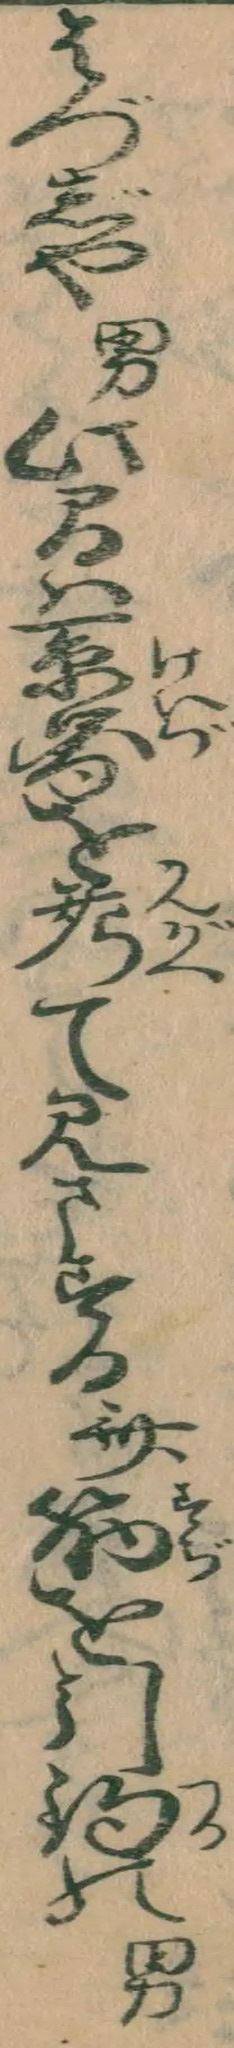はづじや男此間は系図を考て見まする斎筋を引釣の男
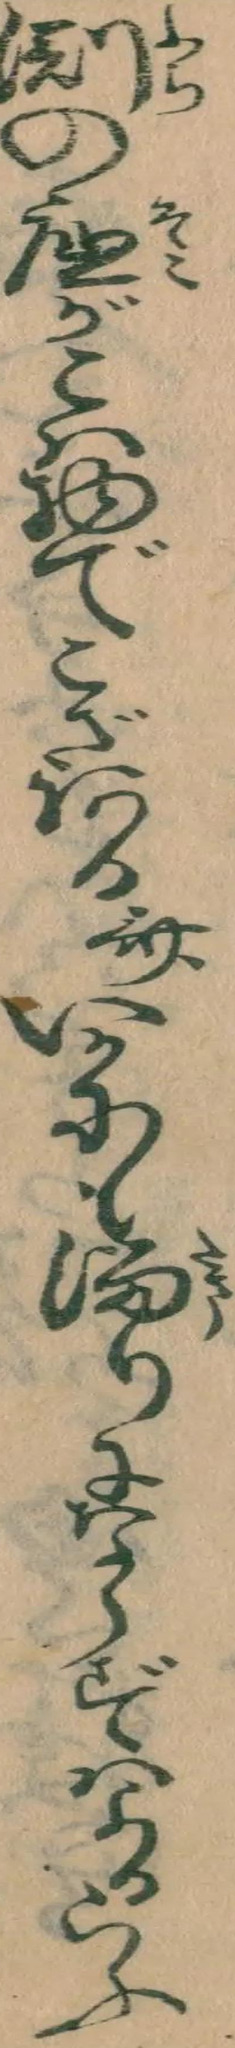淵の底がこは物でこざある斎いかにも溜りにならずはよからふ
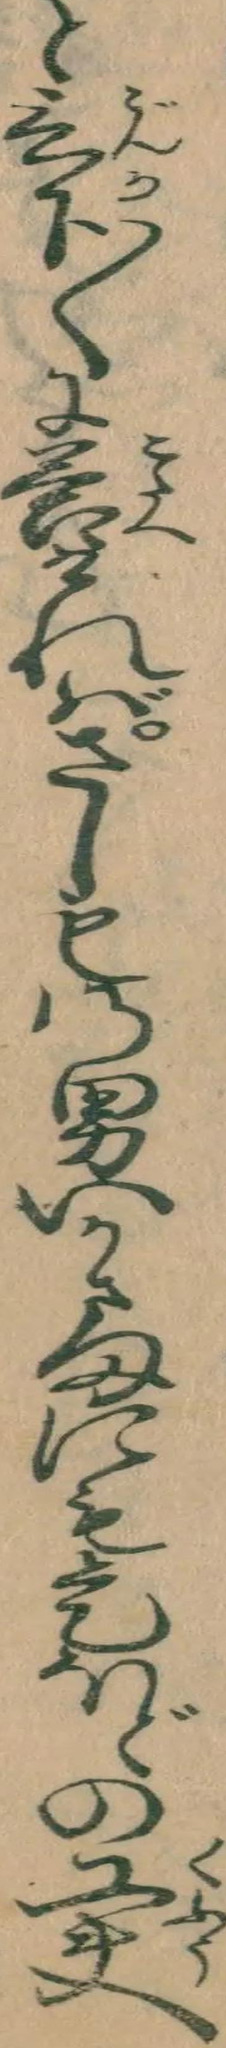と言下〳〵に答ければ。さしもの男いかさまにも是ほどの工夫
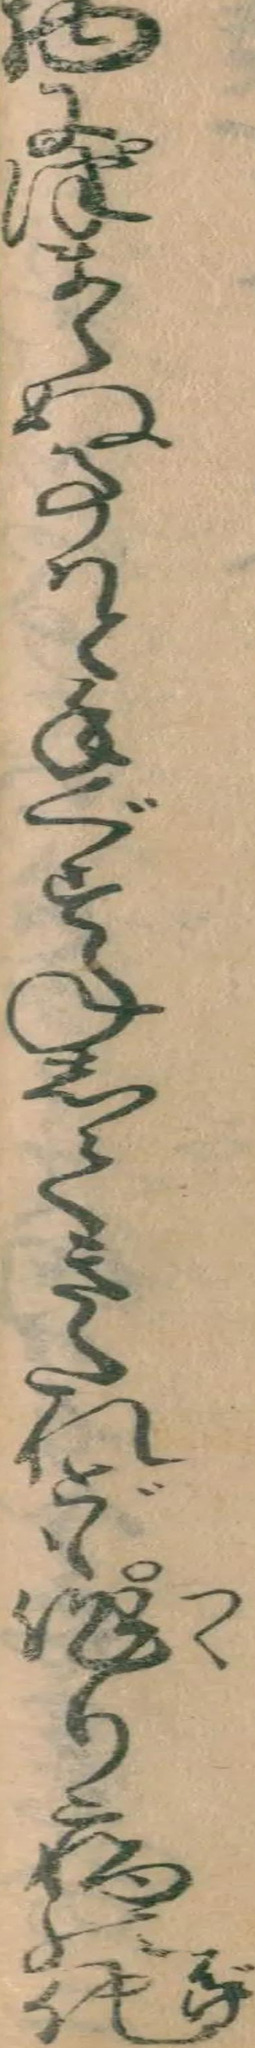物に。つまらぬ事はと手ぐすねしてきたれども。作り病の化
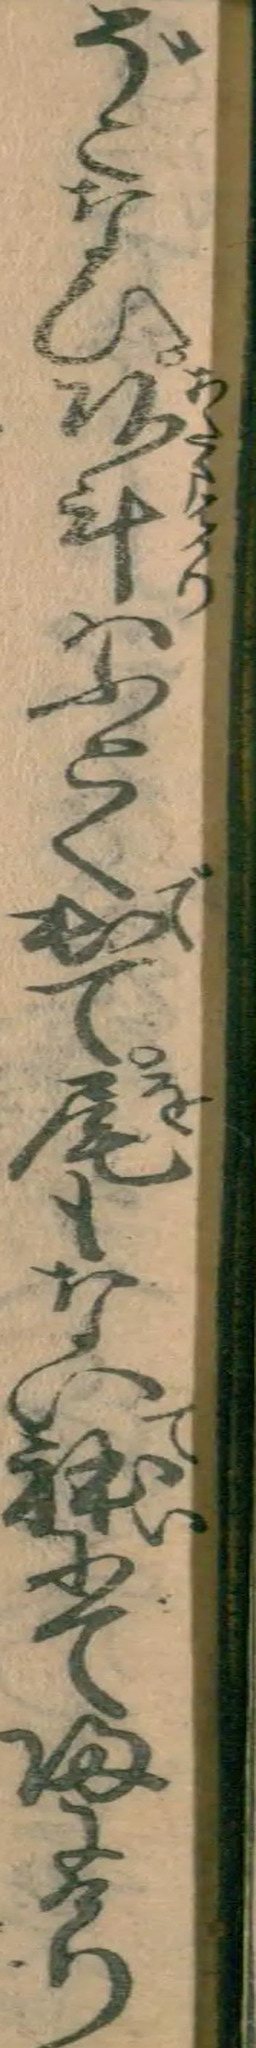ぞこなひ。頭計はふとく出て。尾もない体にて帰にけり
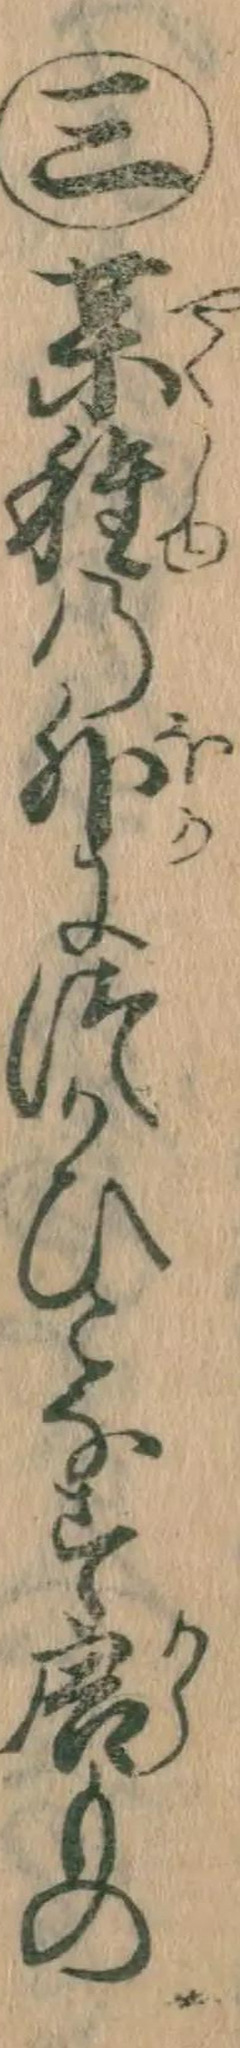三薬種の外につかひこなす唐もの
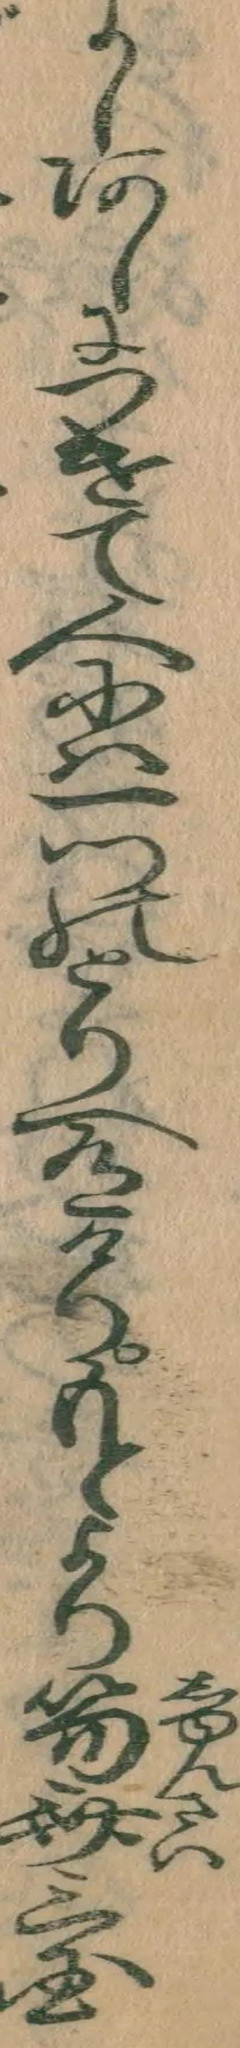よしあしにつけて人には一つのとりへ有けり。もとより筍斎三国
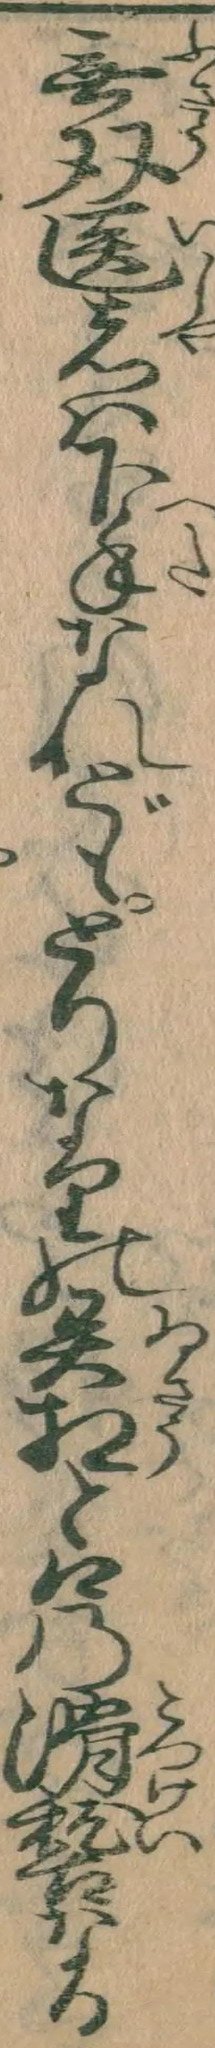無双医者は下手なれども。とりなりの異相と口の滑稽なる
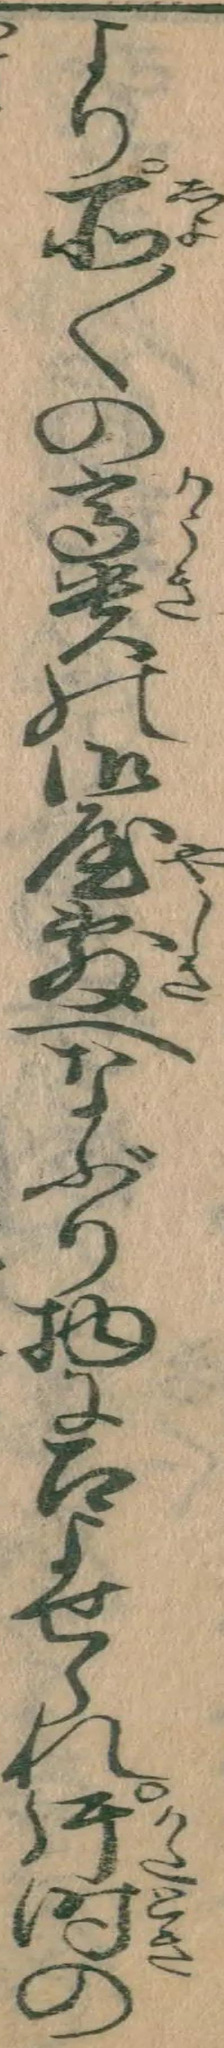より。所々の高貴の御屋敷へなぶり物に召よせられ。片時の
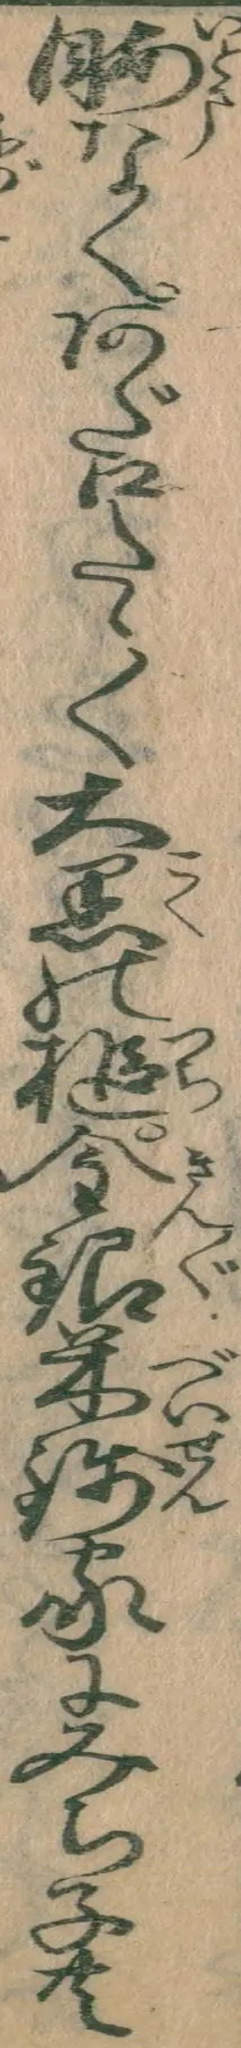暇なく。あだ口たゝ〱大黒の槌。金銀米銭家にみち子共
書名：新竹斎 5巻
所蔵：国立国会図書館 National Diet Library, JAPAN
